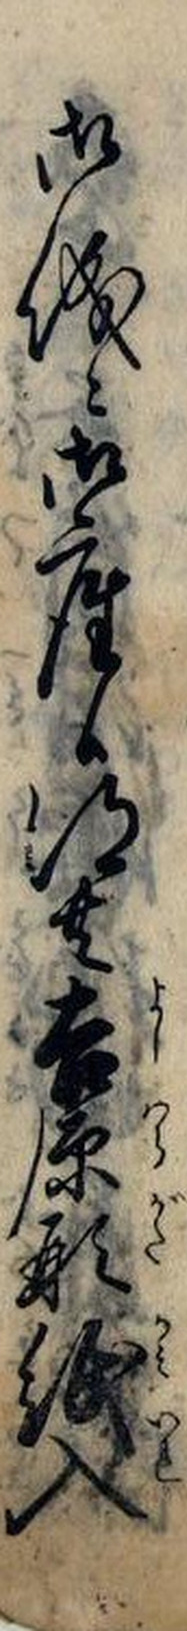御儀に御座候得共吉原形紙入

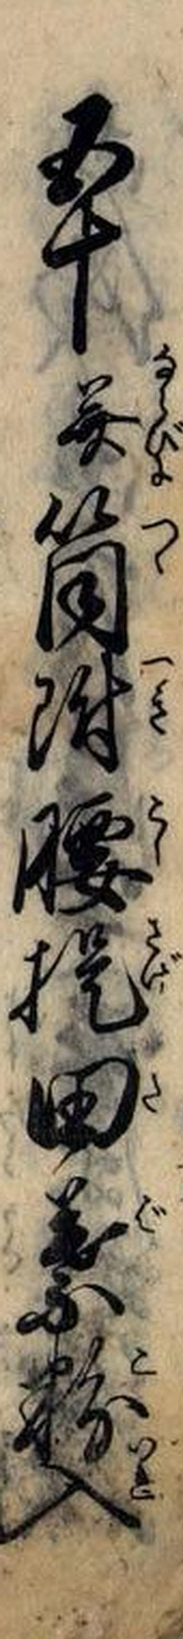五十并筒附腰提田葉粉入
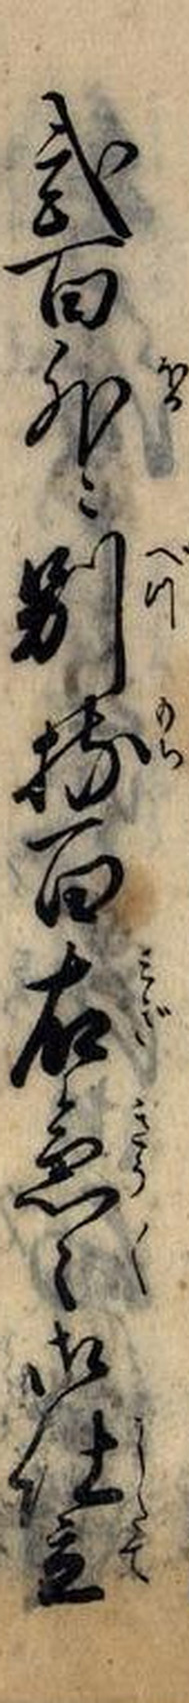弐百外に別持百右急々御仕立
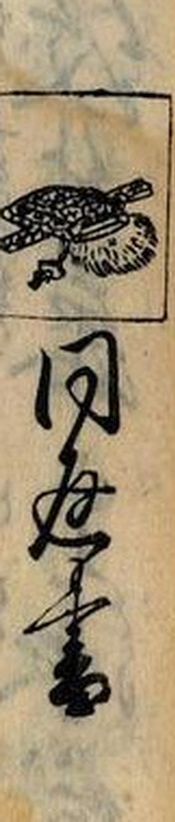同返書
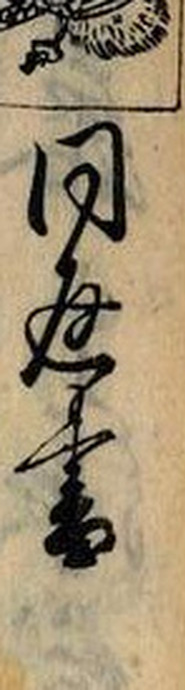同返書
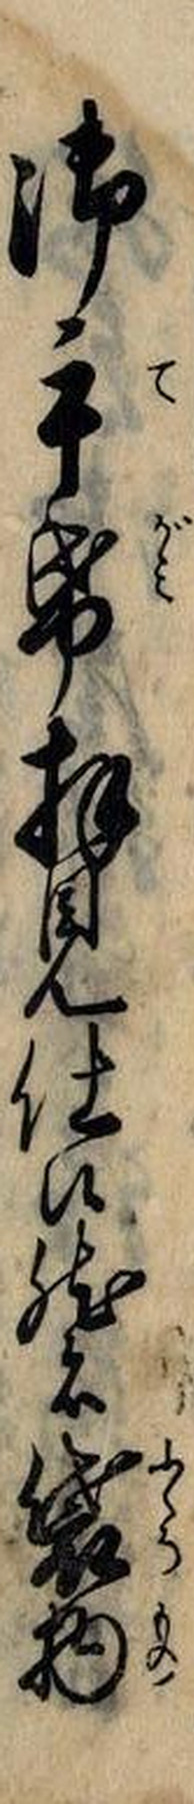御手紙拝見仕候然者袋物
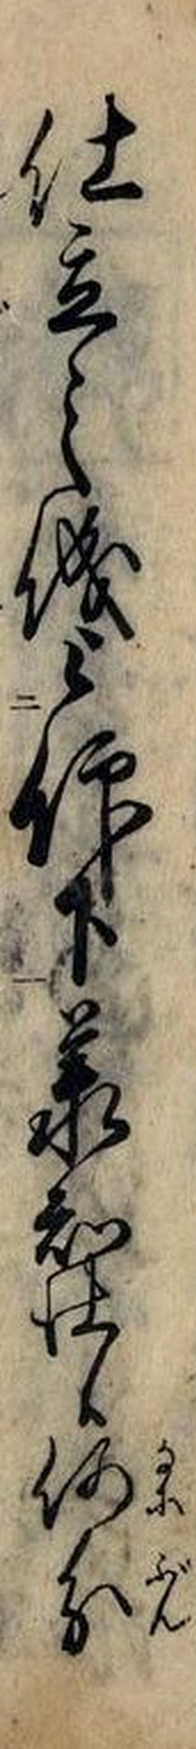仕立之儀被仰下承知仕候何分
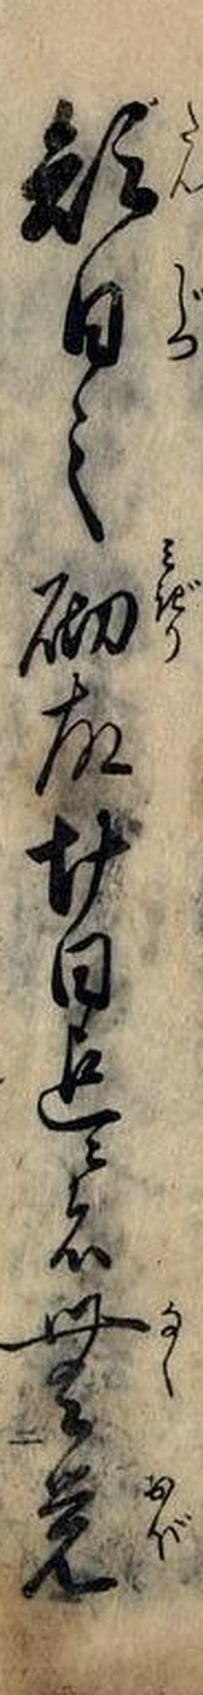短日之砌故廿日迄に者無覚

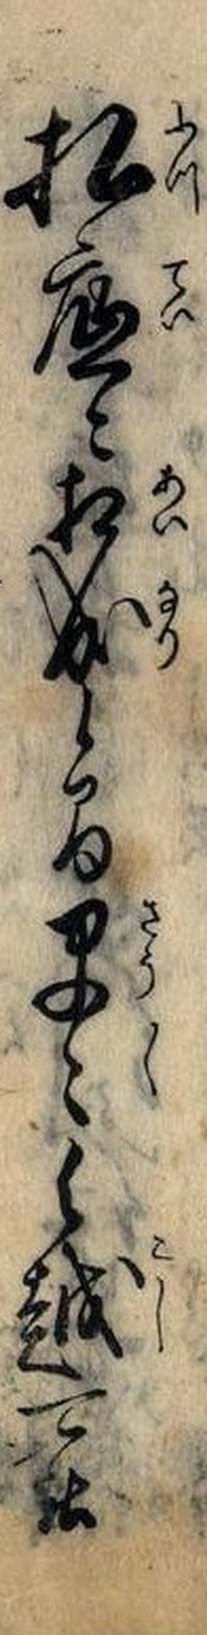払底に相成候間早々御越可被
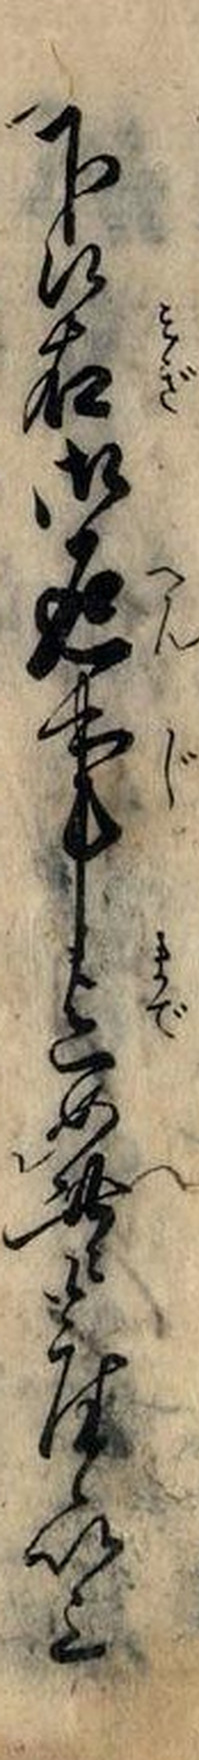下候右御返事迄如此に御座候以上
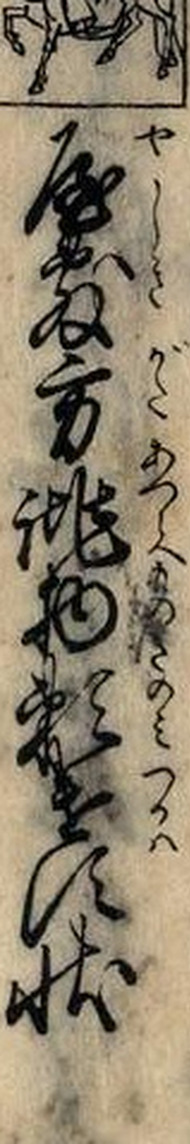屋敷方誂物頼遣す状
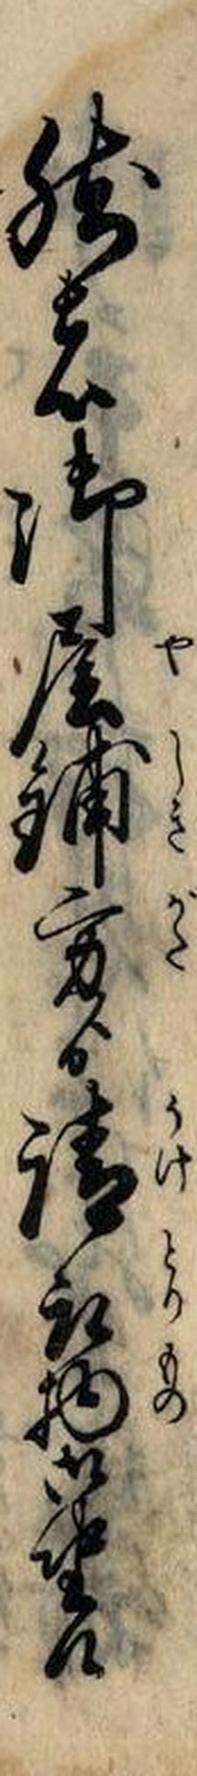然者御屋鋪方ゟ請取物御座候
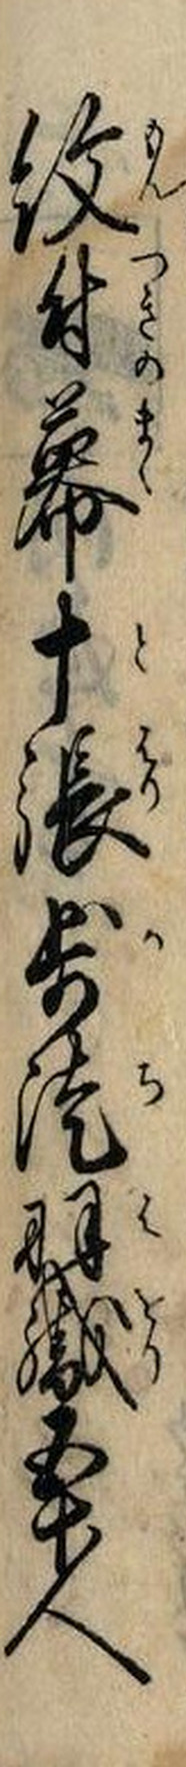紋付幕十張歩徒羽織五十人
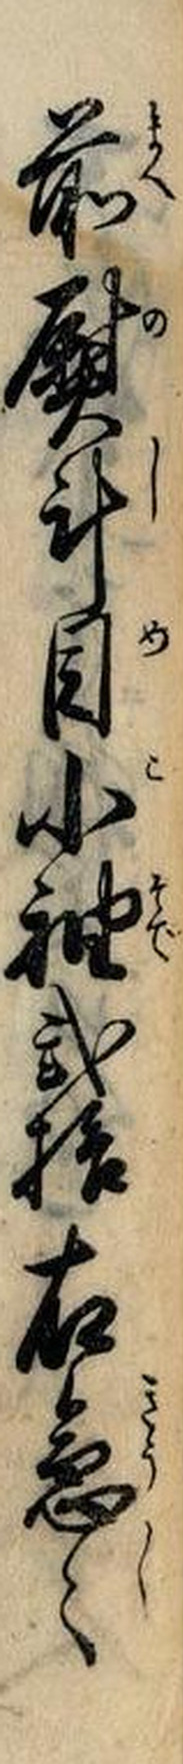前熨斗目小袖弐拾右急々
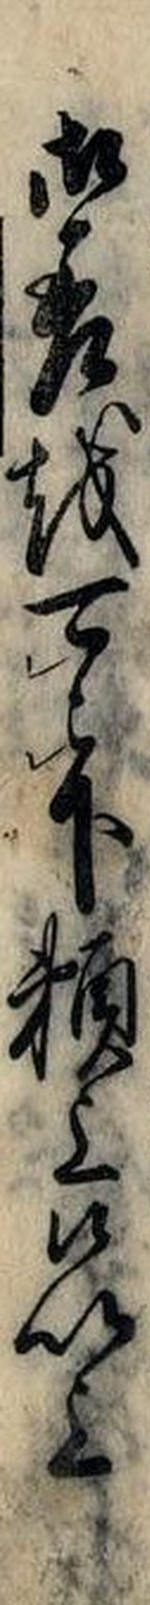御差越可被下頼上候以上
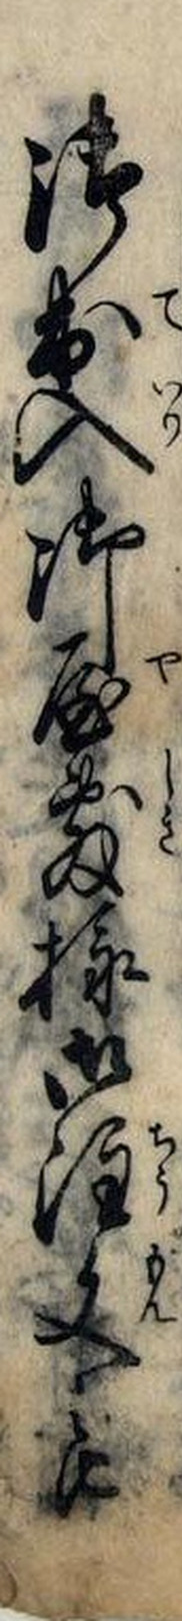御出入御屋敷様御注文之由
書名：大成用文章（往来物）
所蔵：福井県文書館 Fukui Prefectural Archives
